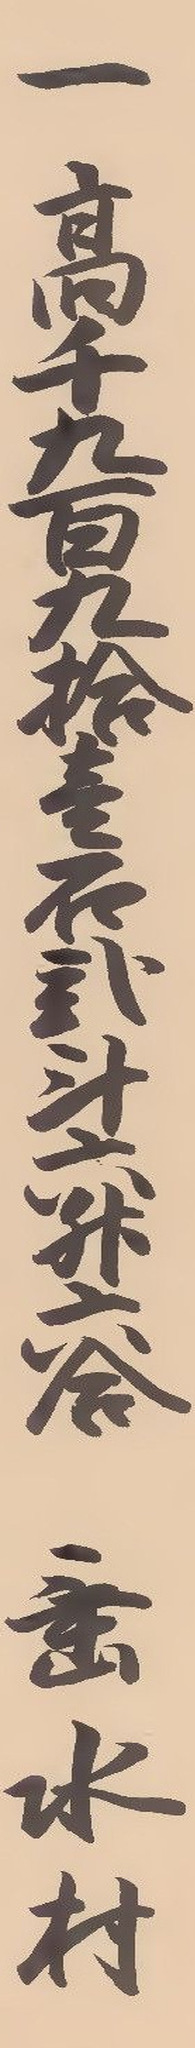一高千九百九拾壱石弐斗六升六合垂水村
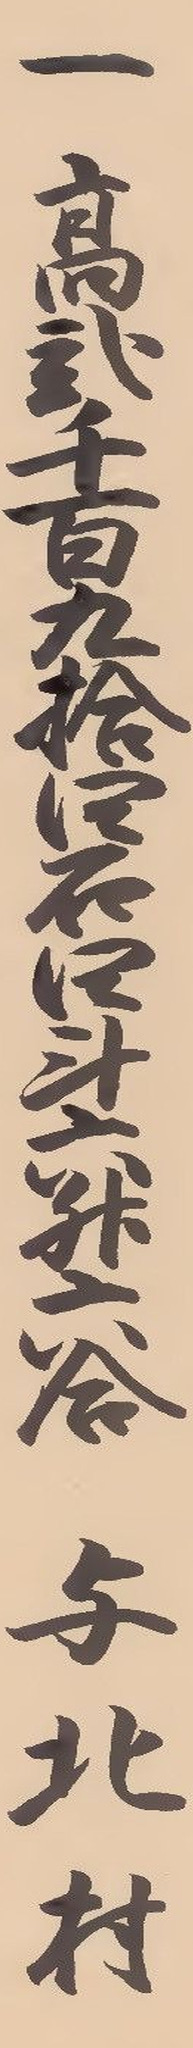一高弐千百九拾四石四斗六升六合与北村
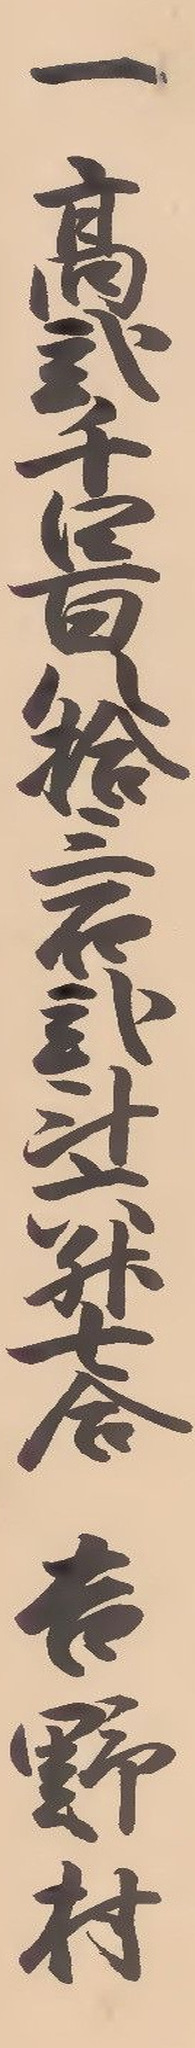一高弐千四百八拾三石弐斗六升七合吉野村
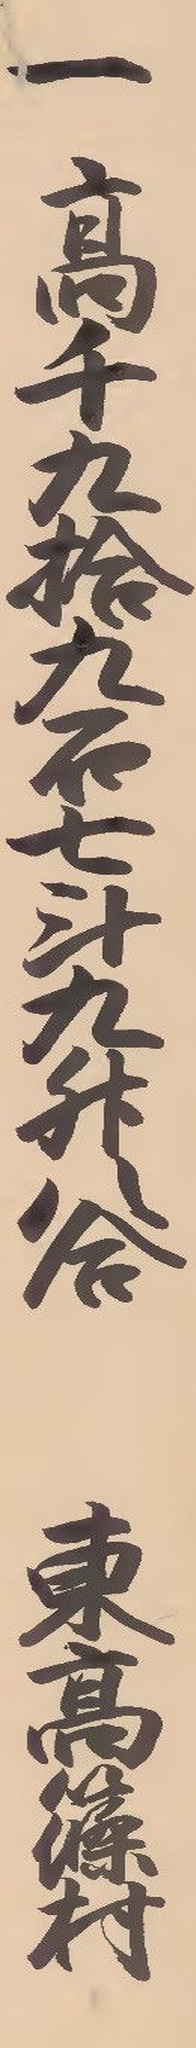一高千九拾九石七斗九升八合東高篠村
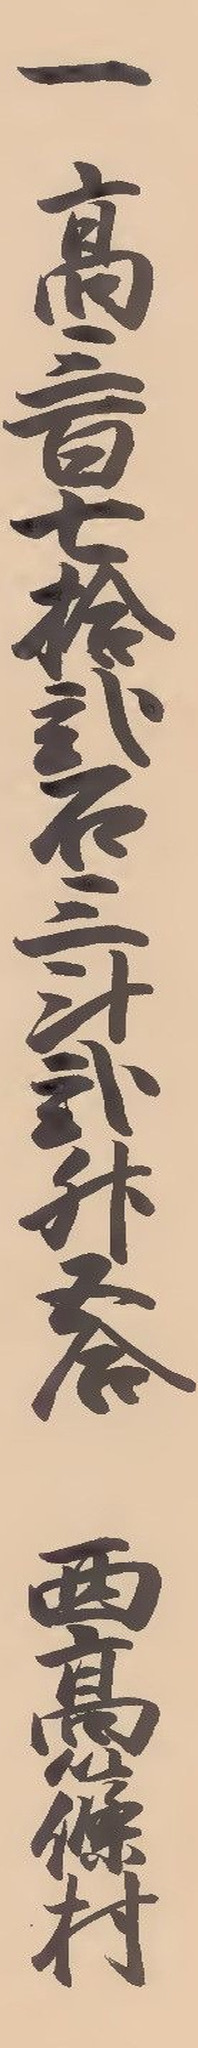一高三百七拾弐石三斗弐升五合西高篠村
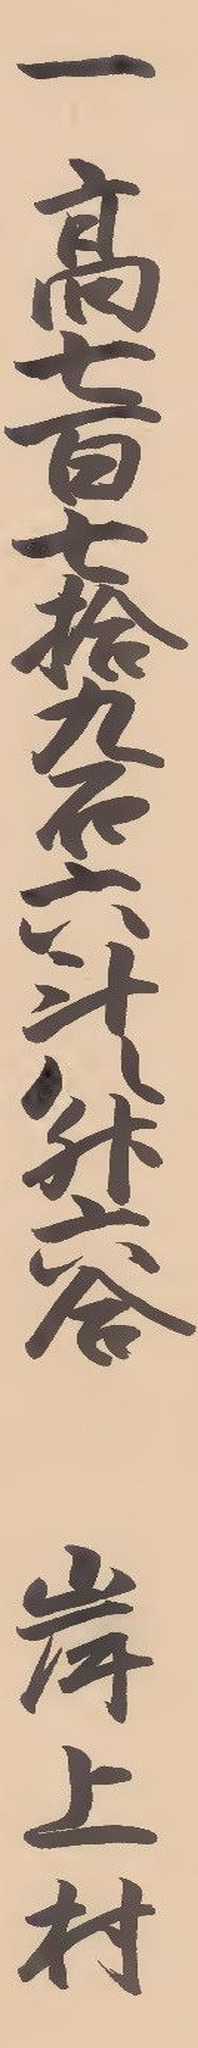一高七百七拾九石六斗八升六合岸上村
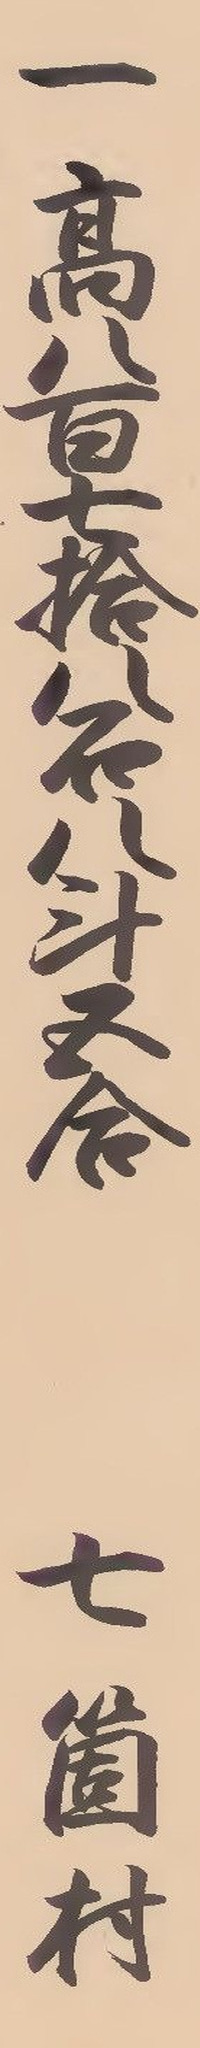一高八百七拾八石八斗五合七箇村

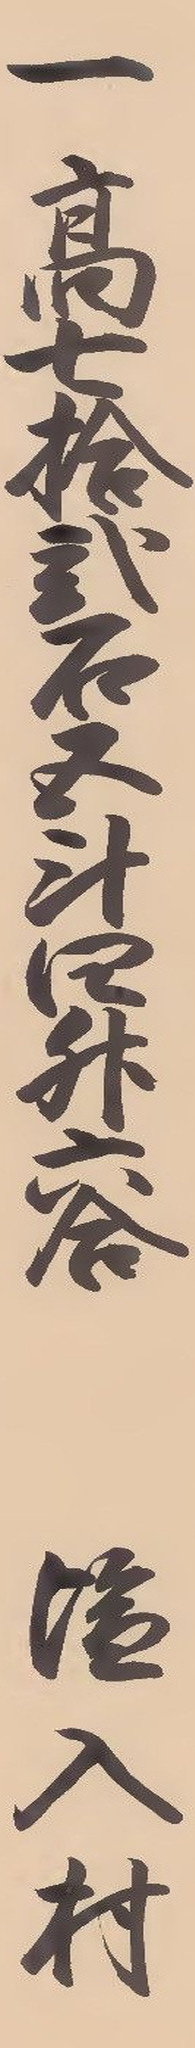一高七拾弐石五斗四升六合塩入村
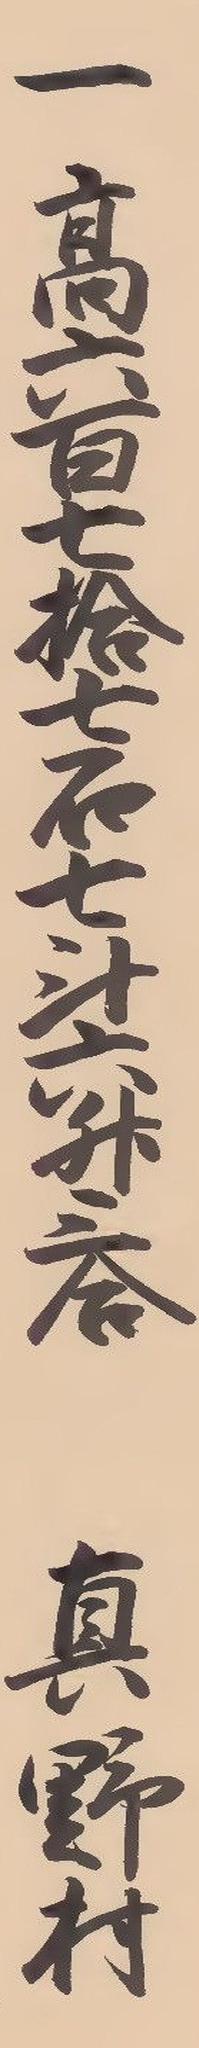一高六百七拾七石七斗六升三合真野村
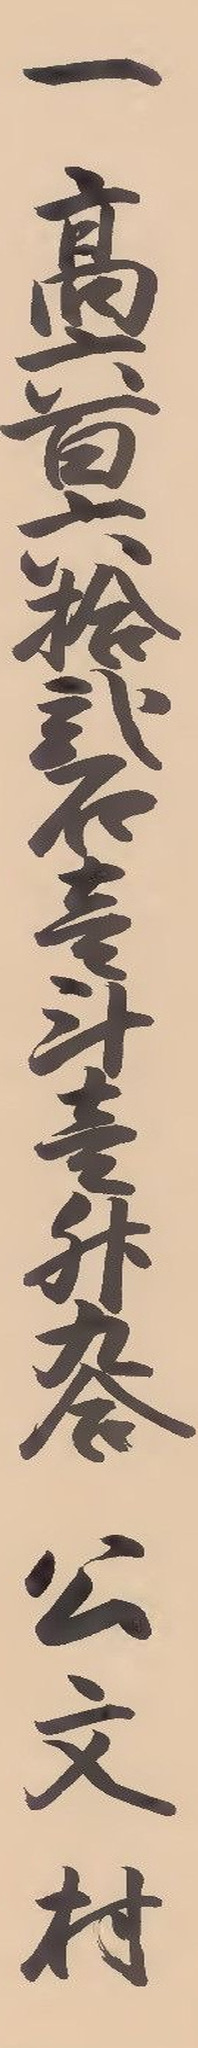一高六百六拾弐石壱斗壱升九合公文村
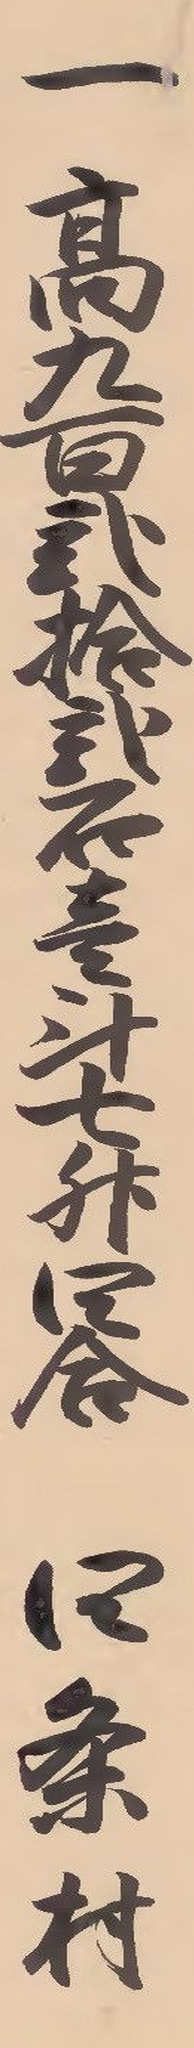一高九百弐拾弐石壱斗七升四合四条村
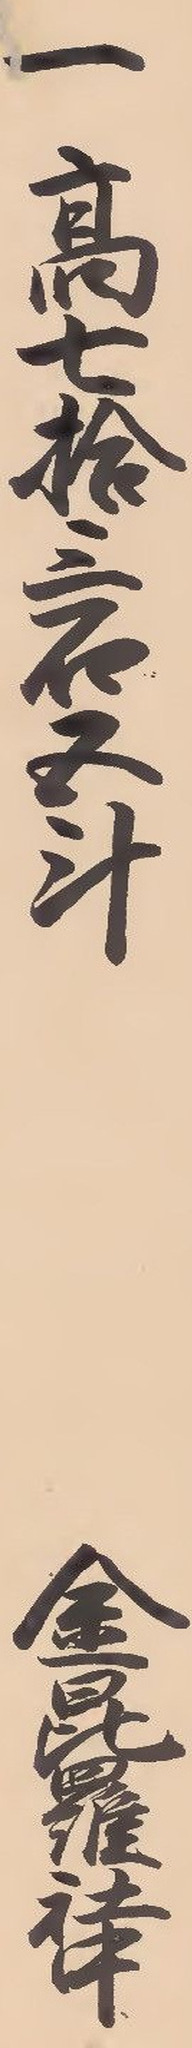一高七拾三石五斗金毘羅社中
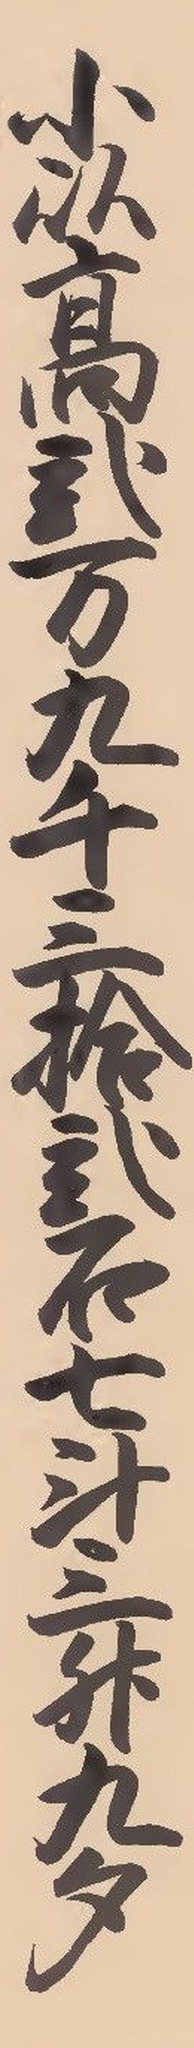小以高弐万九千三拾弐石七斗三升九勺

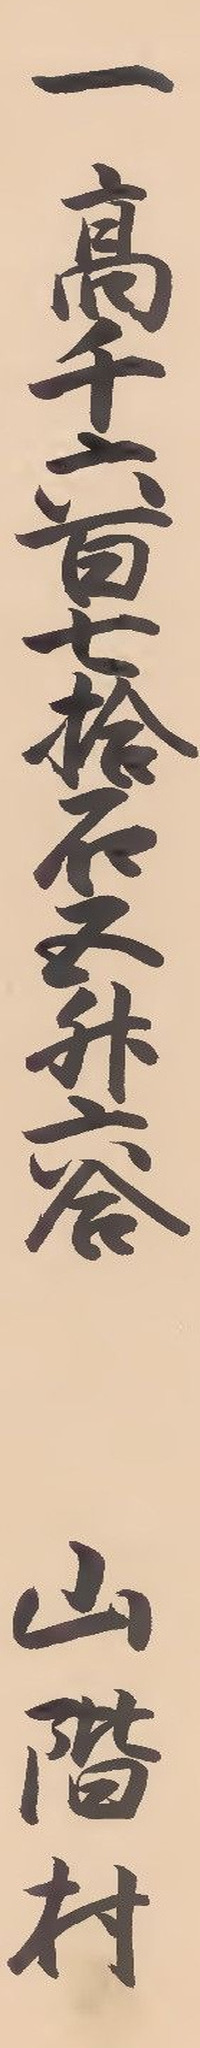一高千六百七拾石五升六合山階村
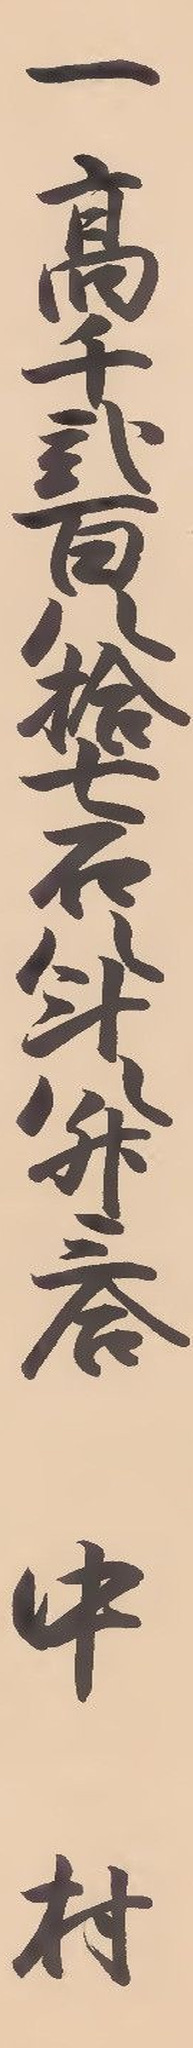一高千弐百八拾七石八斗八升三合中村
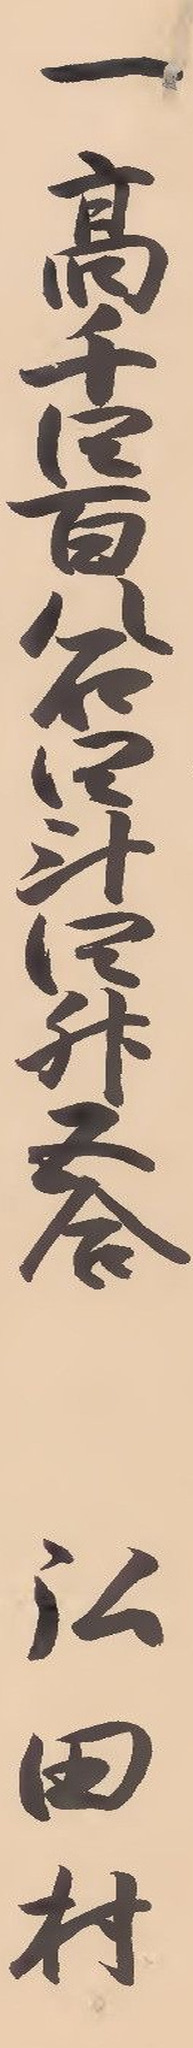一高千四百八石四斗四升五合弘田村
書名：讃岐国郷帳
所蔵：国立公文書館 National Archives of Japan
